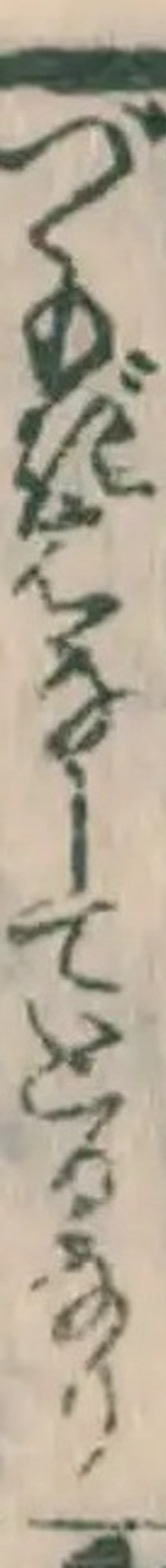づゝもぎはなしてとるなり
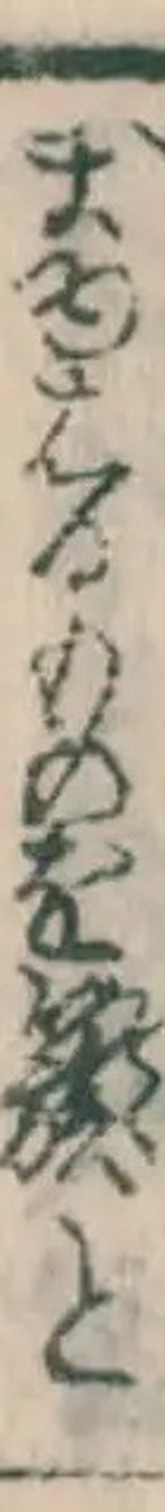まゆはるものを簇と
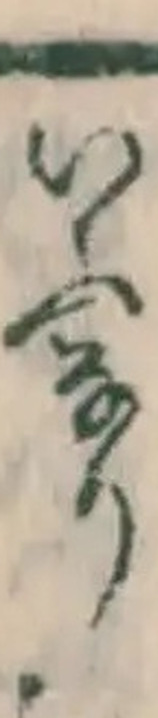いふなり

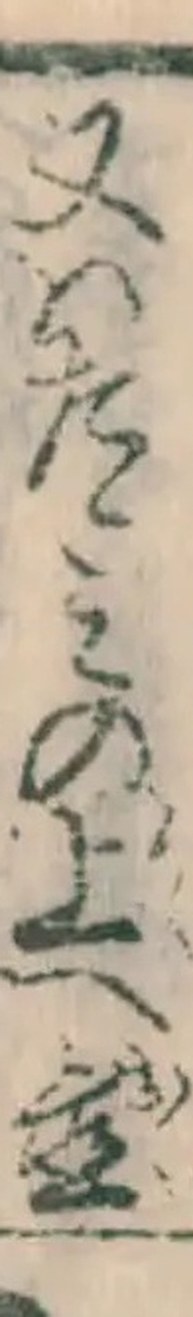又はたゝみの上へ置
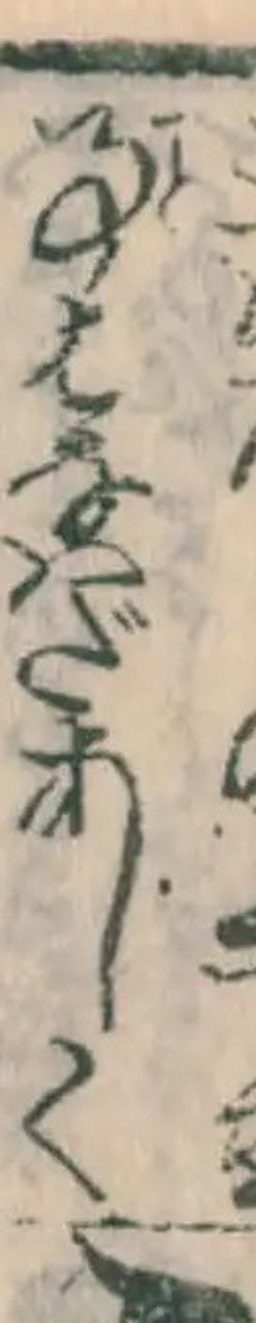事はなはだあしく
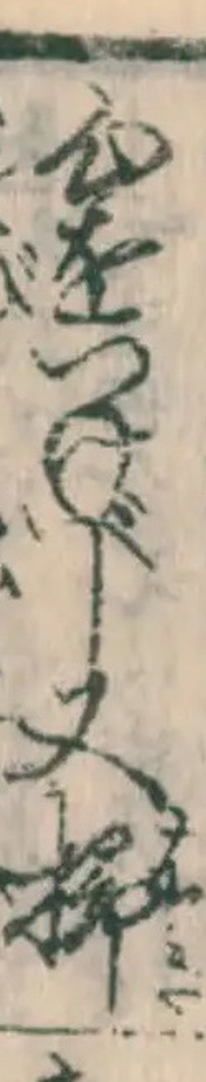心をつけべし又掃
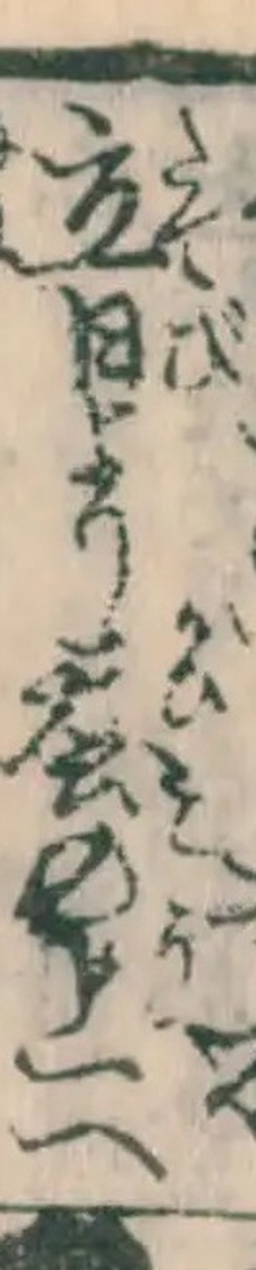立日より蚕の上へ
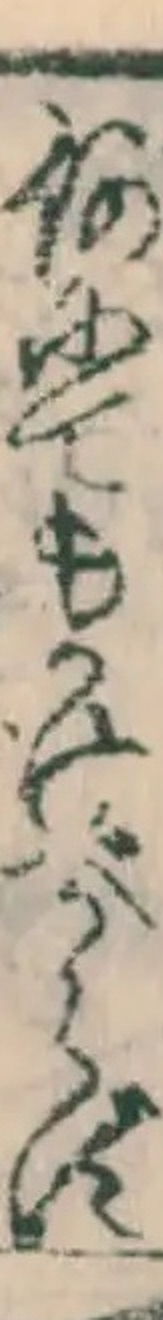何にてもかけべからず
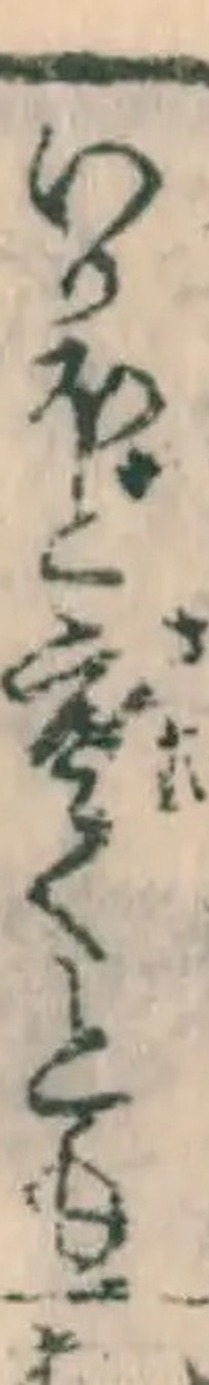いかほど寒くとも
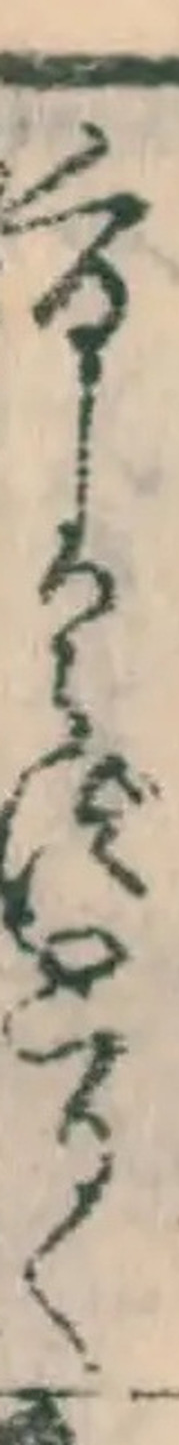くるしからずとかく
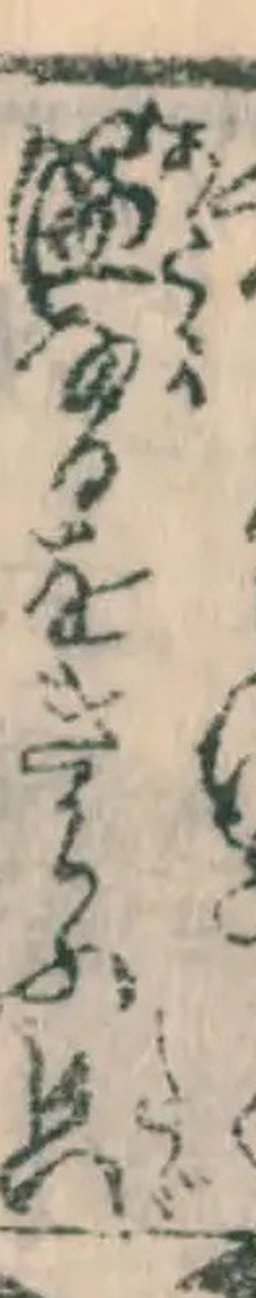温なるをきらふ只
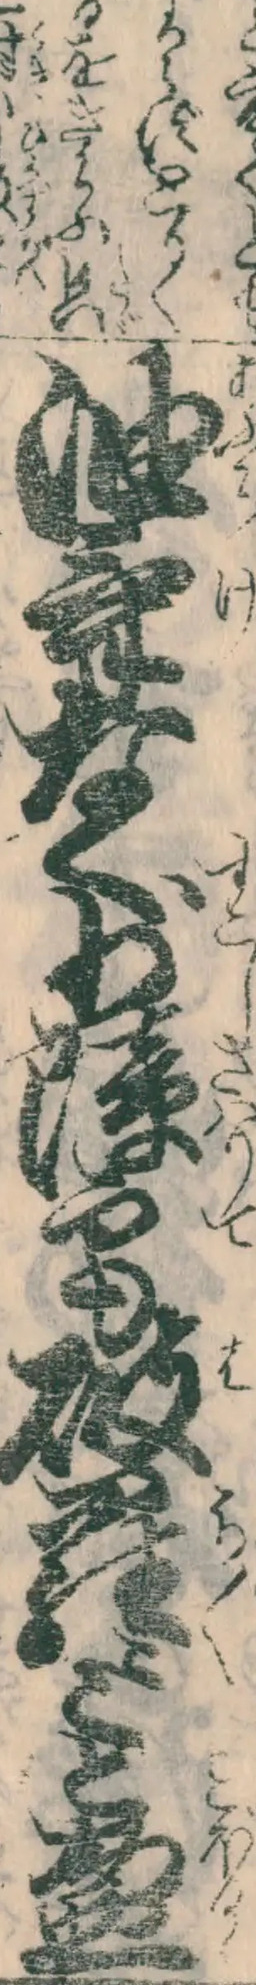油気なく少障而も破羅〻〻と盈
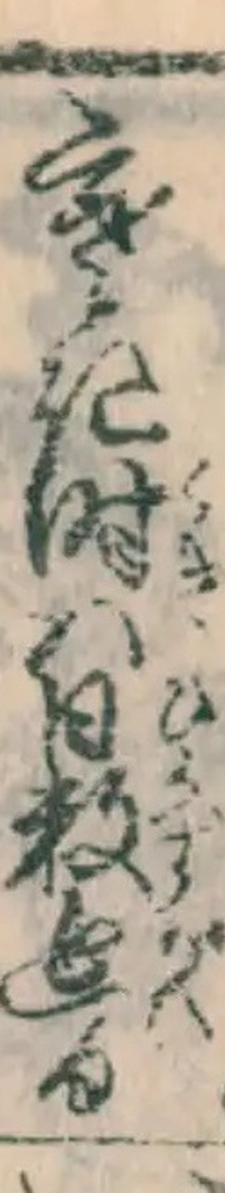寒き時は日数延る
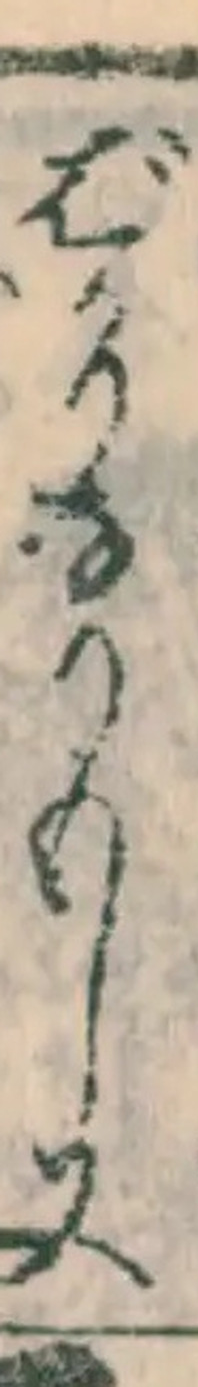ばかりなりもし又
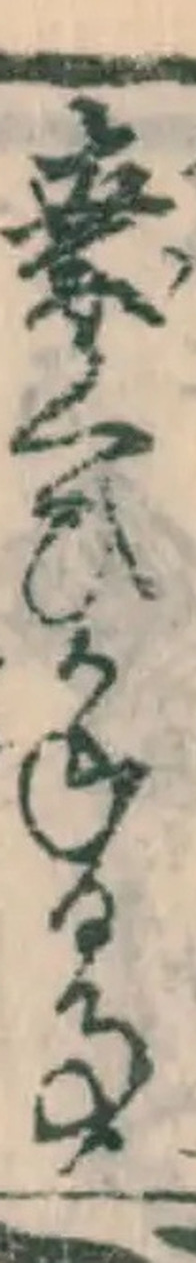桑くひかねる事
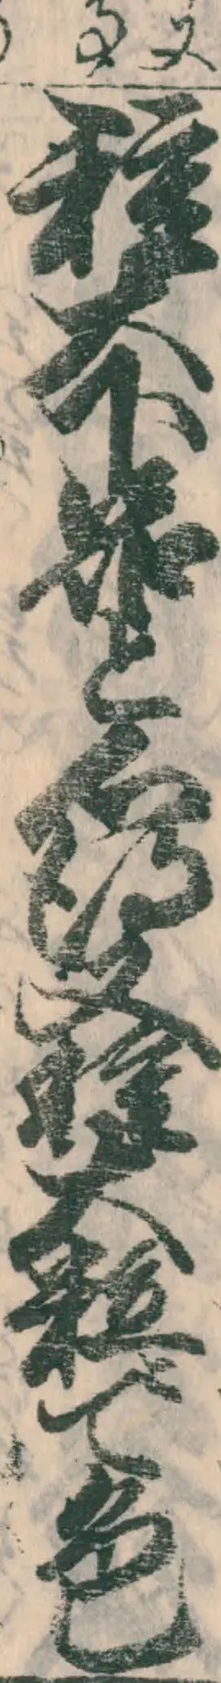種大下品と心得又種大粒にて色
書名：養蚕往来
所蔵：国立国会図書館 National Diet Library, JAPAN
